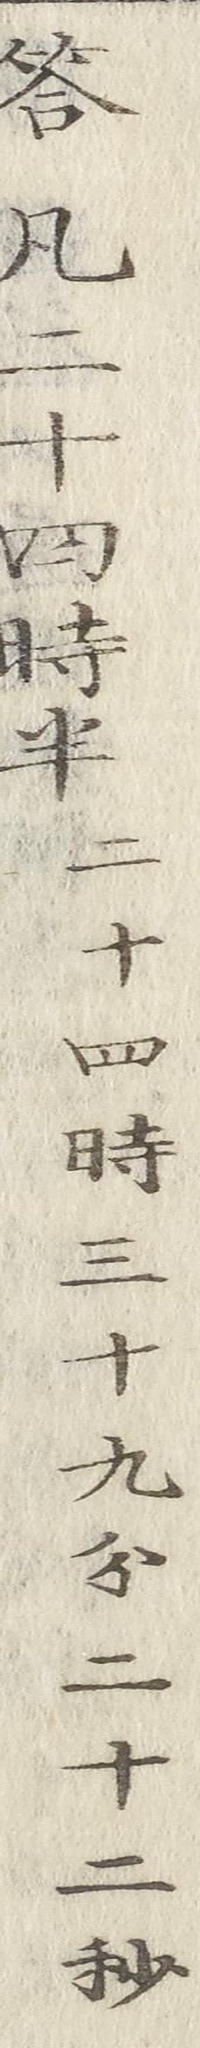答凡二十四時半二十四時三十九分二十二秒
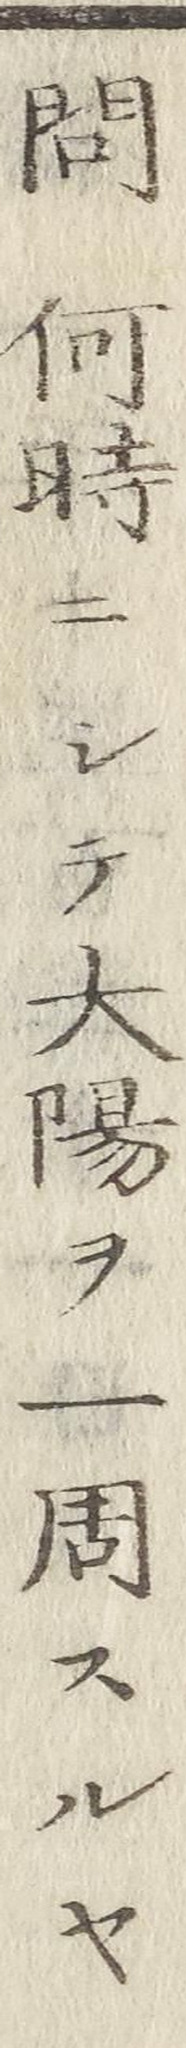問何時ニシテ大陽ヲ一周スルヤ

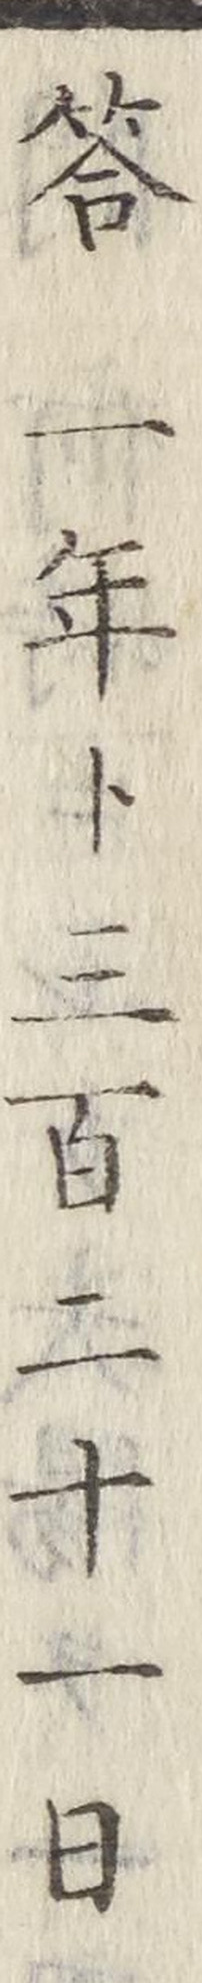答一年ト三百二十一日
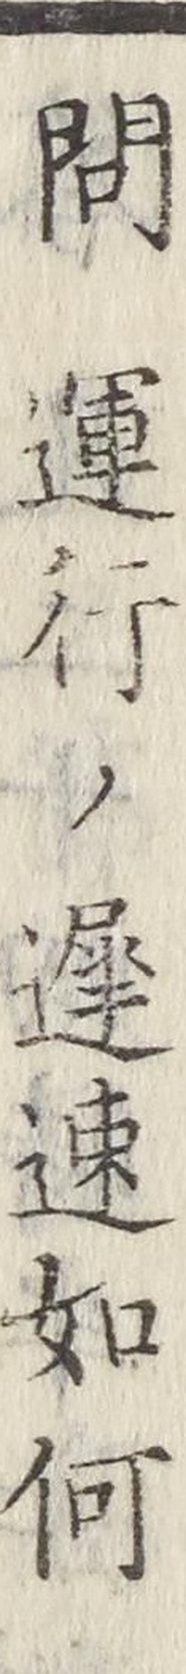問運行ノ遅速如何
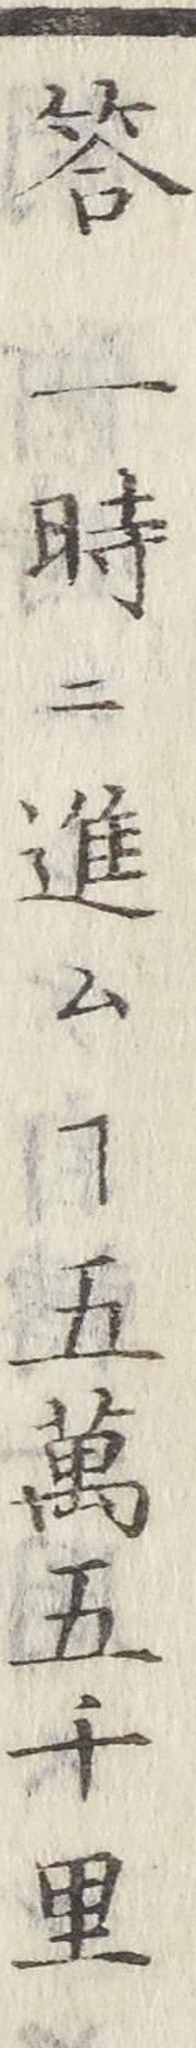答一時ニ進ムコト五万五千里
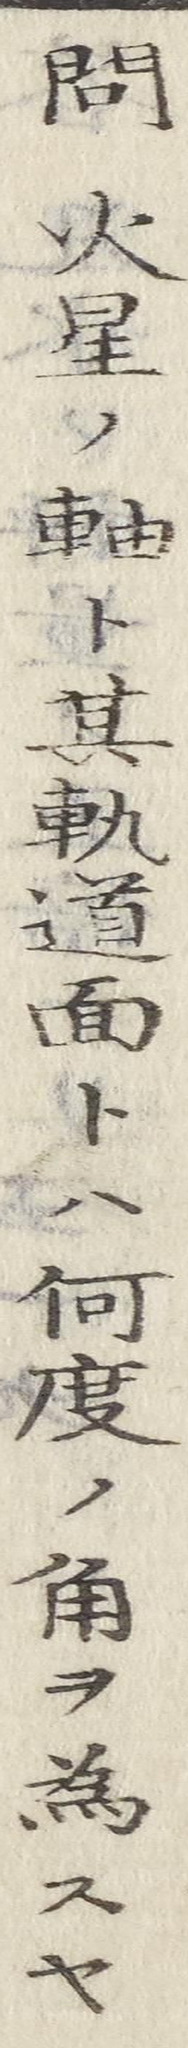問火星ノ軸ト其軌道面トハ何度ノ角ヲ為スヤ
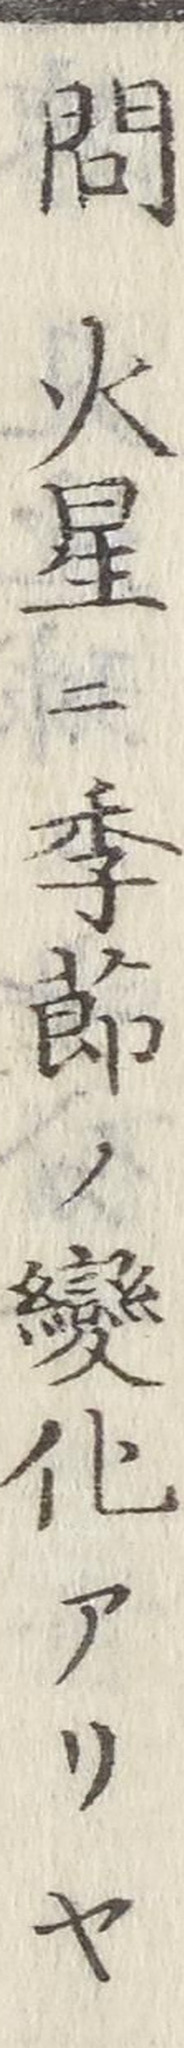問火星ニ季節ノ変化アリヤ
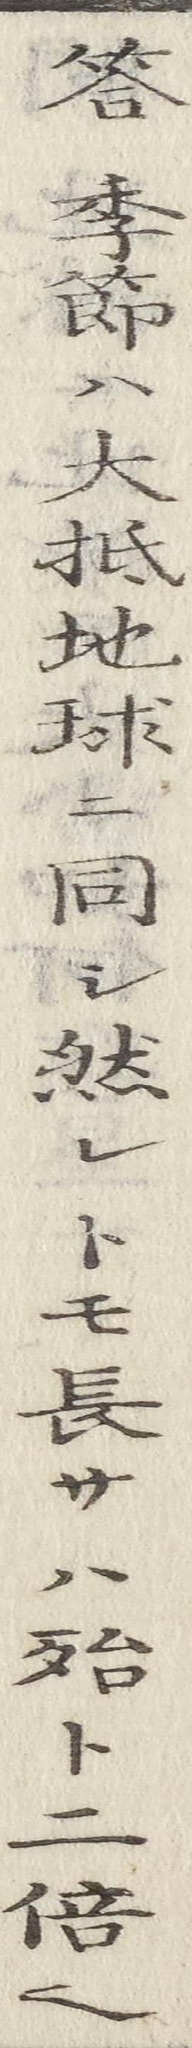答季節ハ大抵地球ニ同シ然レトモ長サハ殆ト二倍也
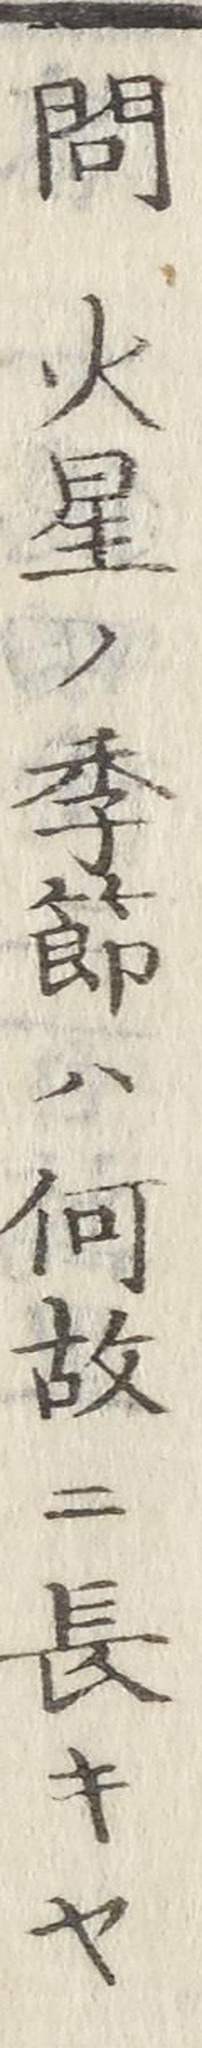問火星ノ季節ハ何故ニ長キヤ
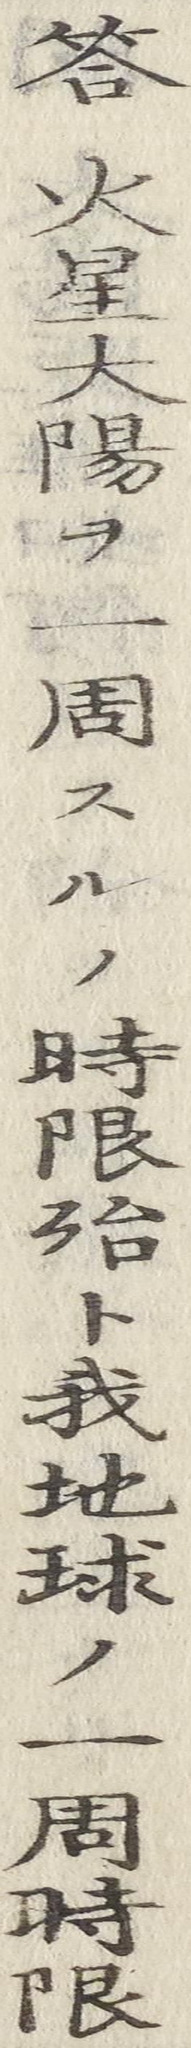答火星大陽ヲ一周スルノ時殆ト我地球ノ一周時限
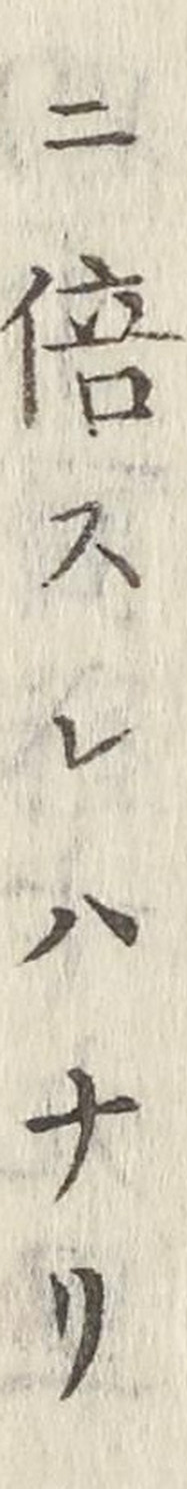ニ倍スレハナリ
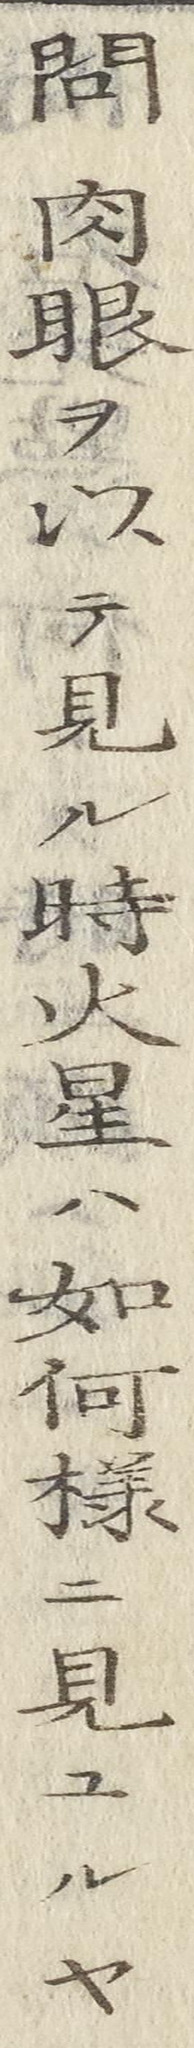問肉眼ヲ以テ見ル時火星ハ如何様ニ見ユルヤ
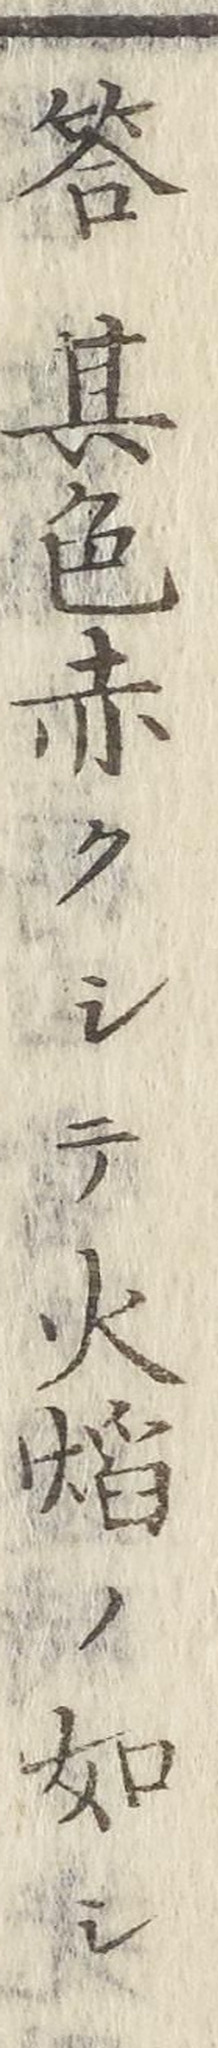答其色赤クシテ火焰ノ如シ
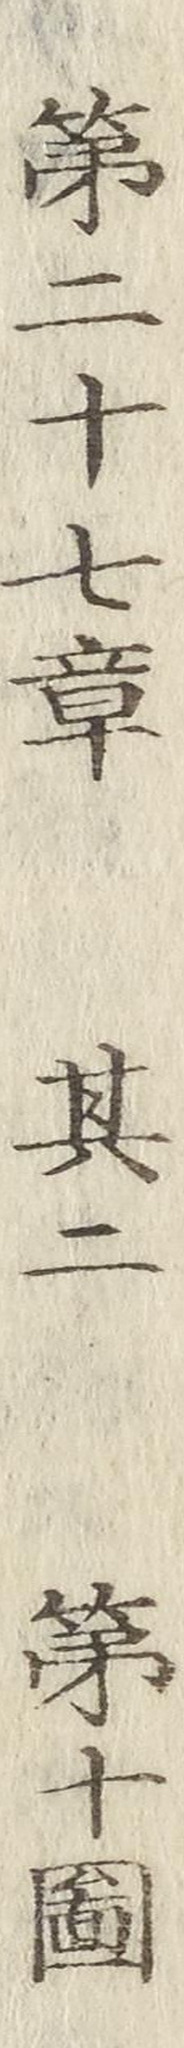第二十七章其二第十図
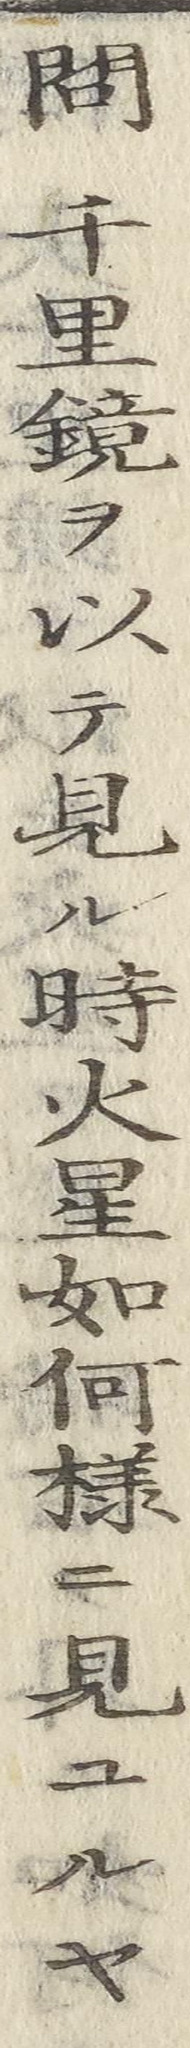問千里鏡ヲ以テ見ル時火星如何ニ見ユルヤ
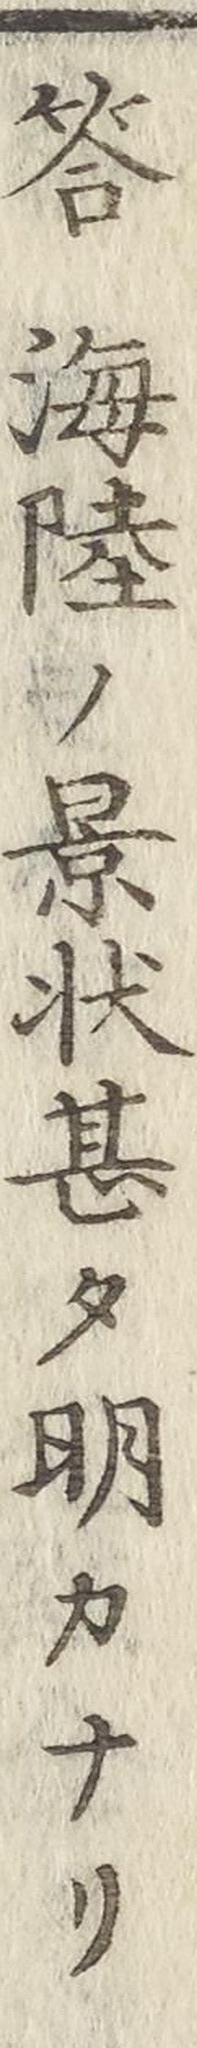答海陸ノ景状甚タ明カナリ
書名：星学圖説　上
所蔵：東京大学地震研究所図書室 Earthquake Research Institute Library, The University of Tokyo, JAPAN
